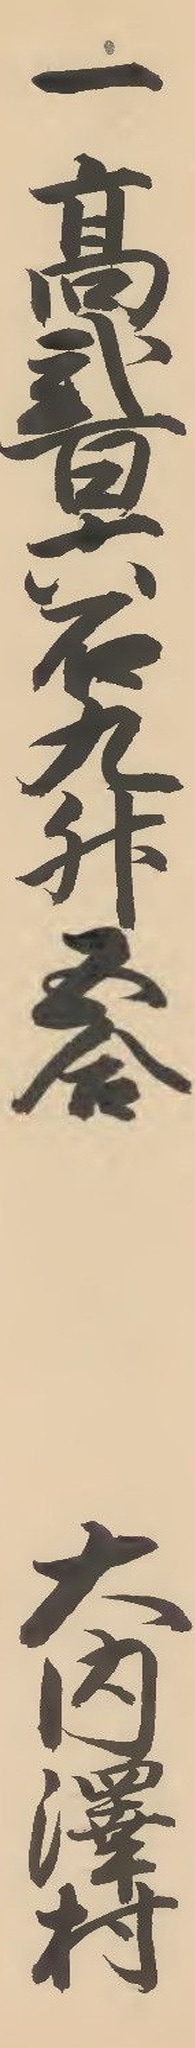一高弐百六石九升五合大内澤村
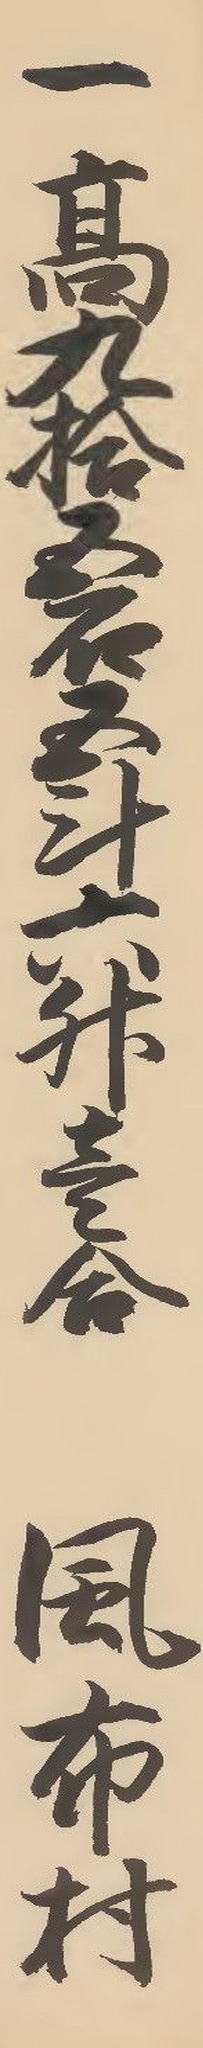一高九拾五石五斗六升壱合風布村
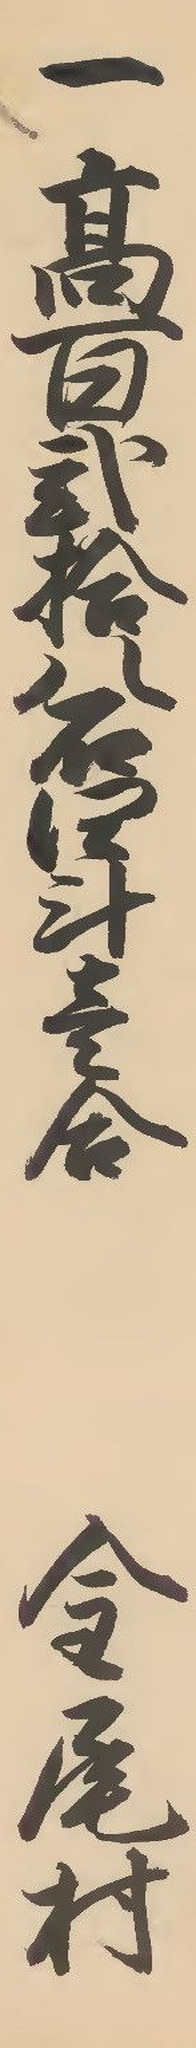一高百弐拾八石四斗壱合金尾村

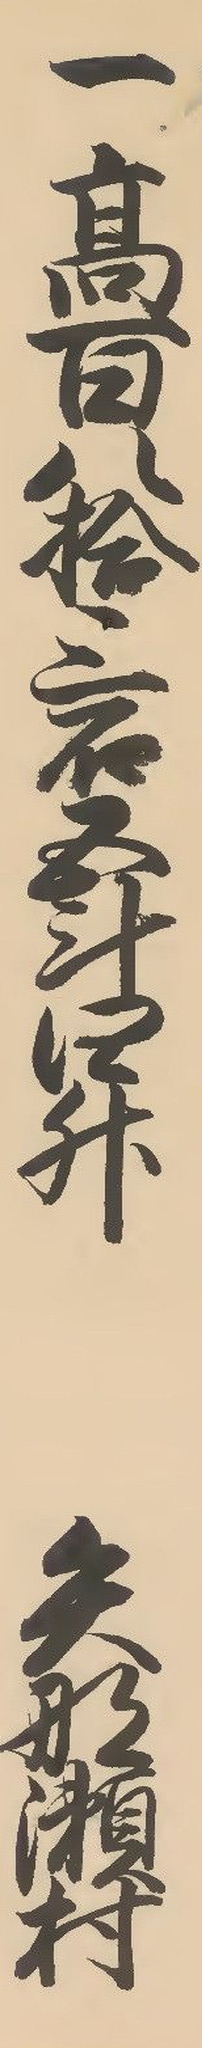一高百八拾三石五斗四升矢那瀬村
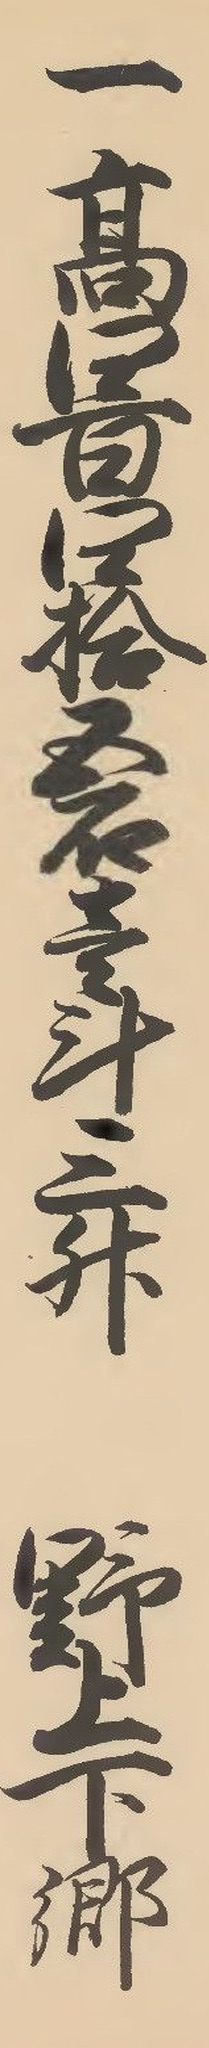一高四百四拾五石壱斗三升野上下郷
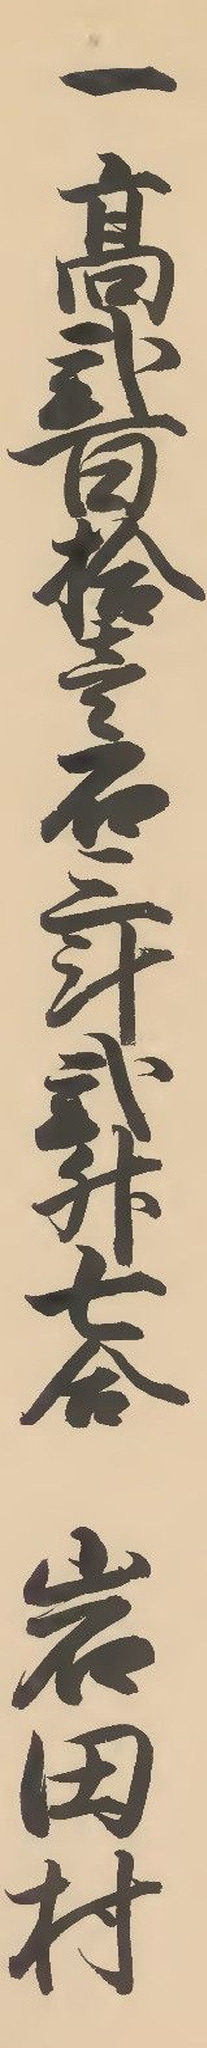一高弐百拾壱石三斗弐升七合岩田村
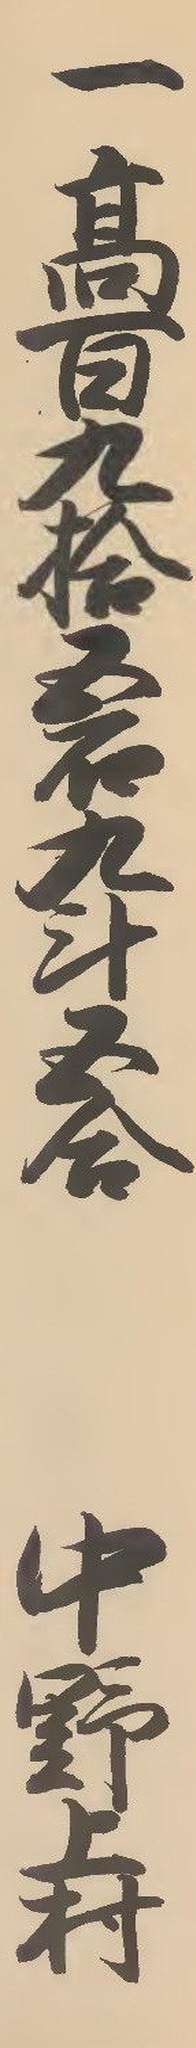一高百九拾五石九斗五合中野上村
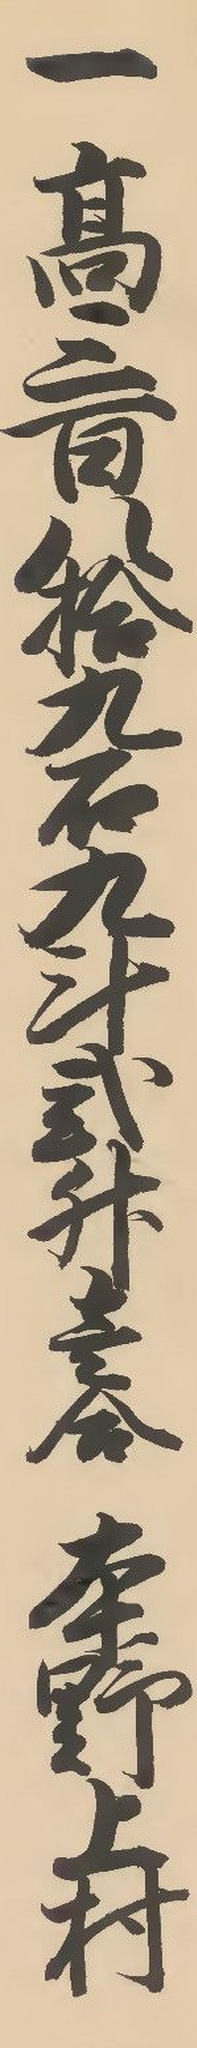一高三百八拾九石九斗弐升壱合本野上村
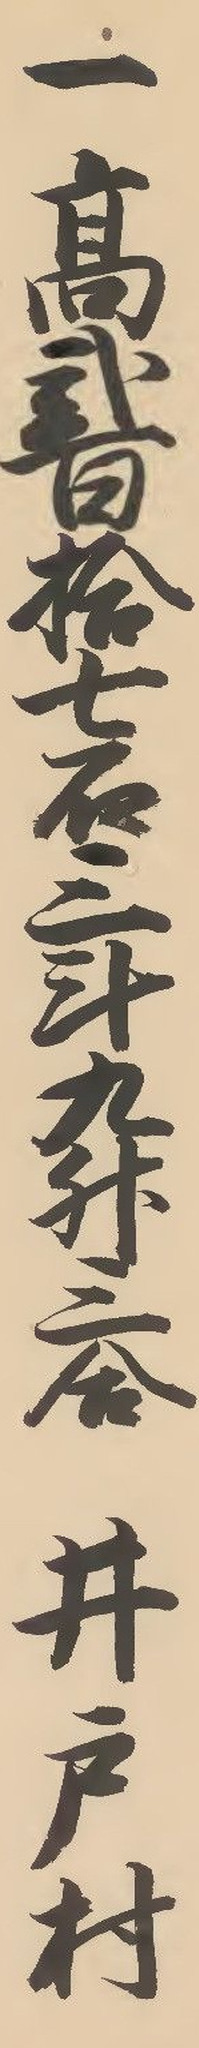一高弐百拾七石三斗九升三合井戸村
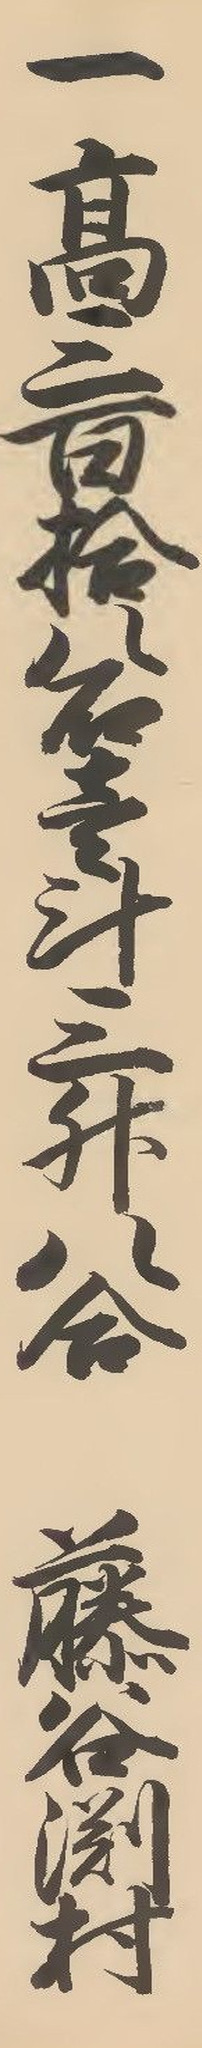一高三百拾八石壱斗三升八合藤谷渕村
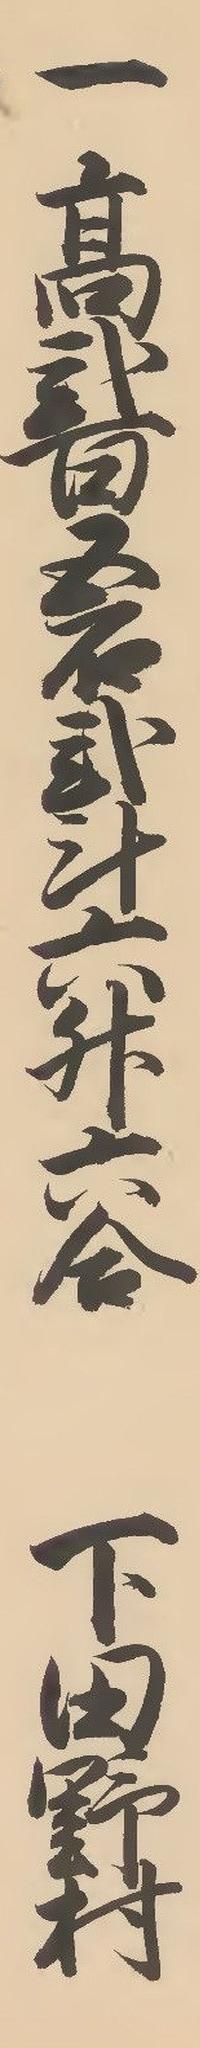一高弐百五石弐斗六升六合下田野村

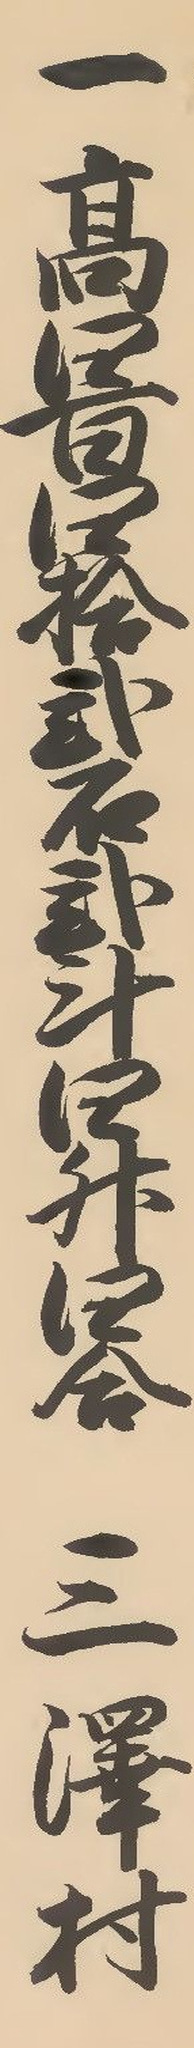一高四百四拾弐石弐斗四升四合三澤村
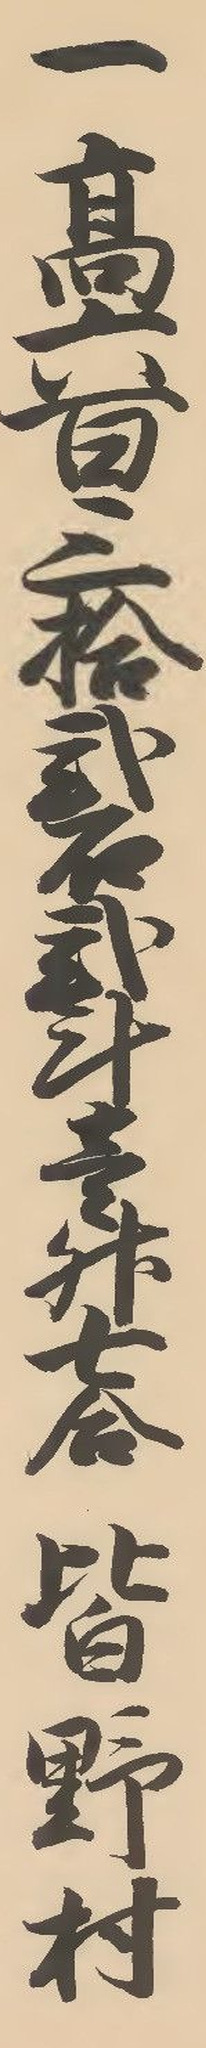一高六百三拾弐石弐斗壱升七合皆野村
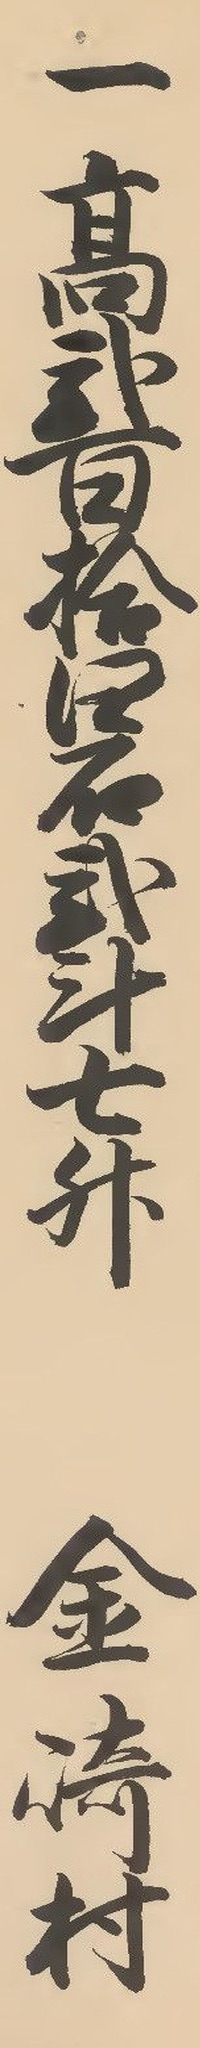一高弐百拾四石弐斗七升金崎村
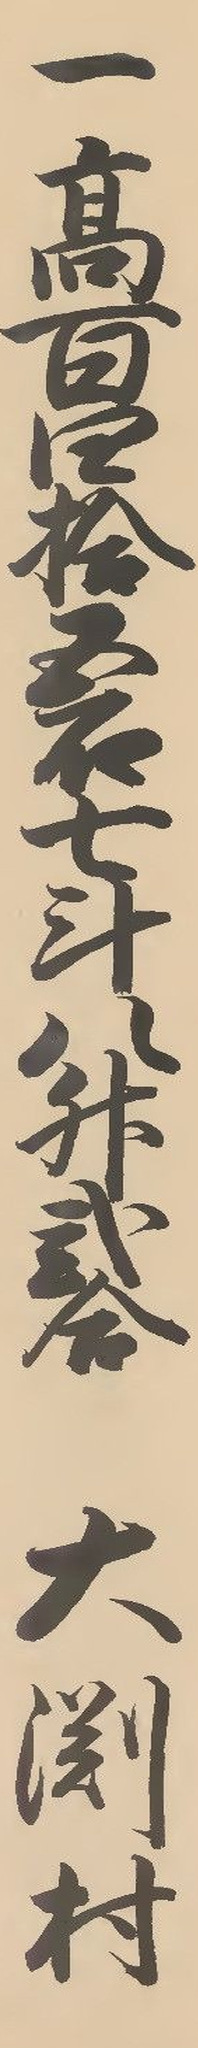一高百四拾五石七斗八升弐合大渕村
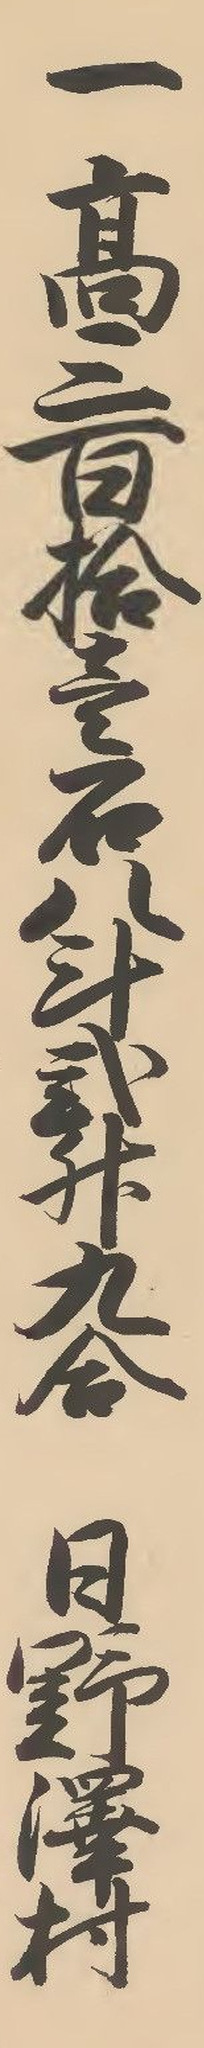一高三百拾壱石八斗弐升九合日野澤村
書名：武蔵国郷帳　上
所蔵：国立公文書館 National Archives of Japan
